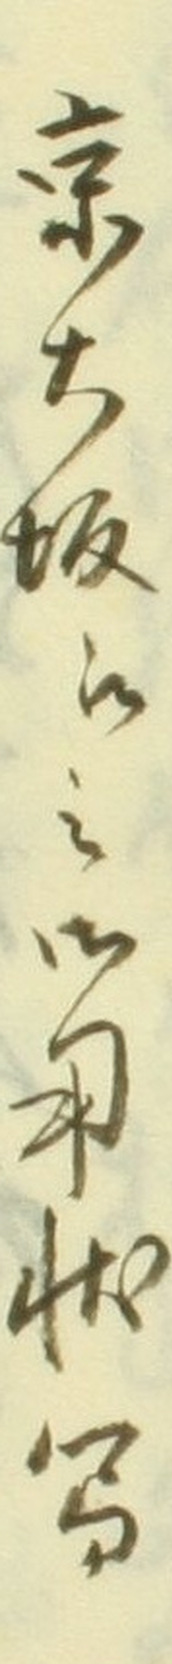京大坂え之御用状写
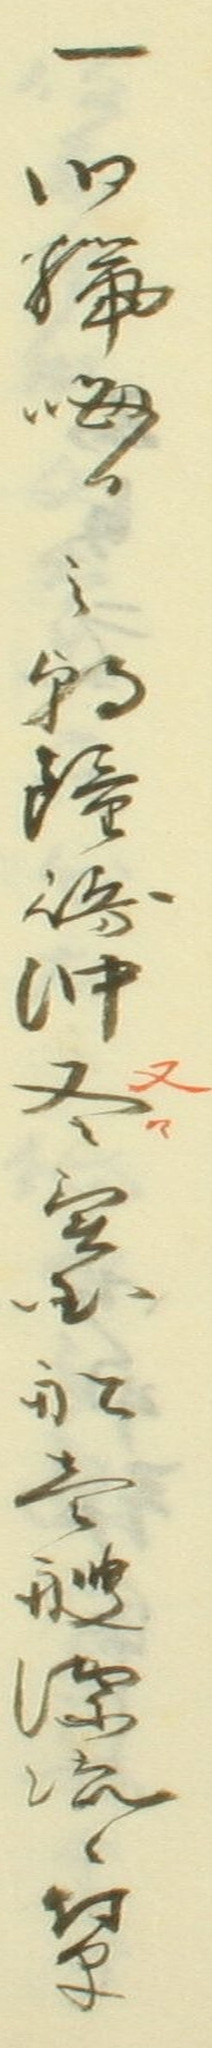一旧臘晦日之朝鐘崎沖又々異国船壱艘漂流に付早
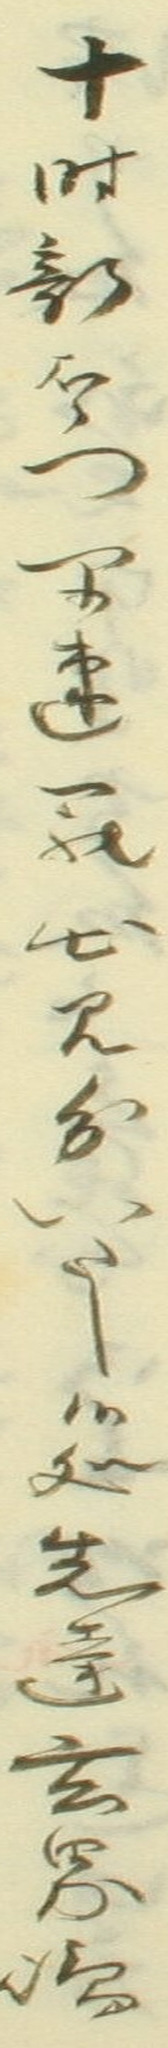十時新右衛門早速罷出見分いたし候処先達玄界島
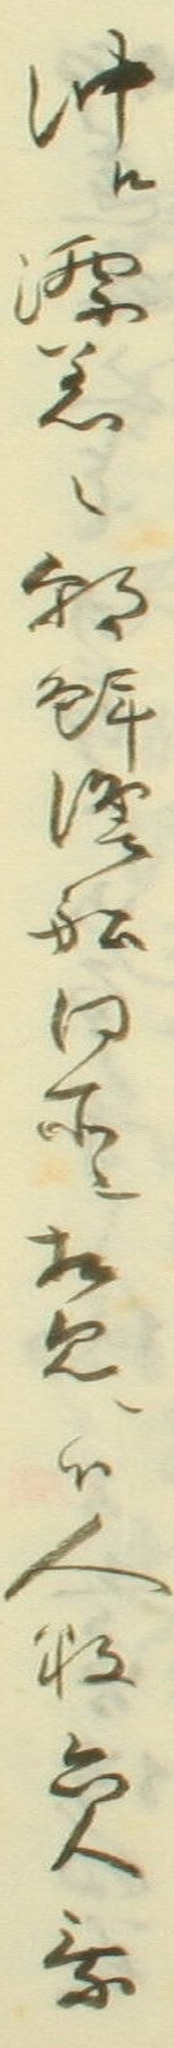沖え漂着之朝鮮漁船同所に相見へ候人数六人乗
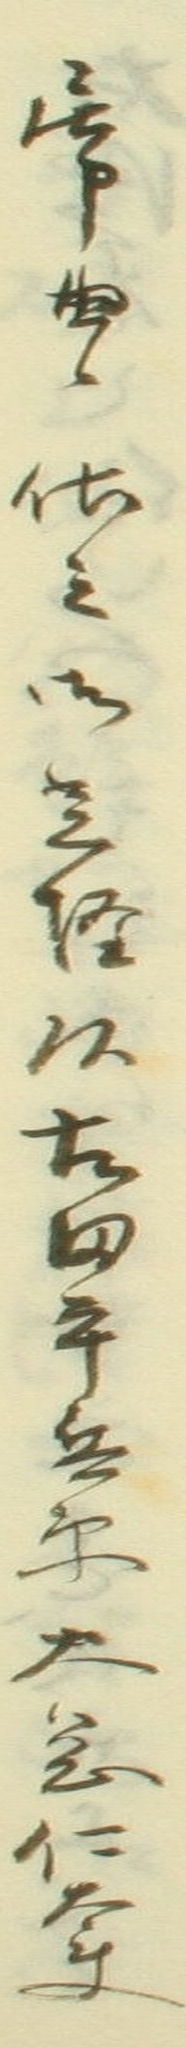居申由候依之足軽頭平兵衛大岡仁太夫
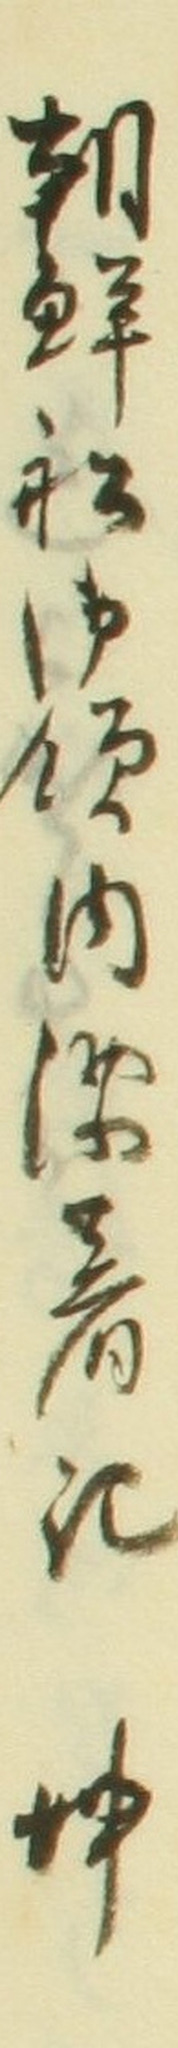朝鮮船御領内漂着記坤

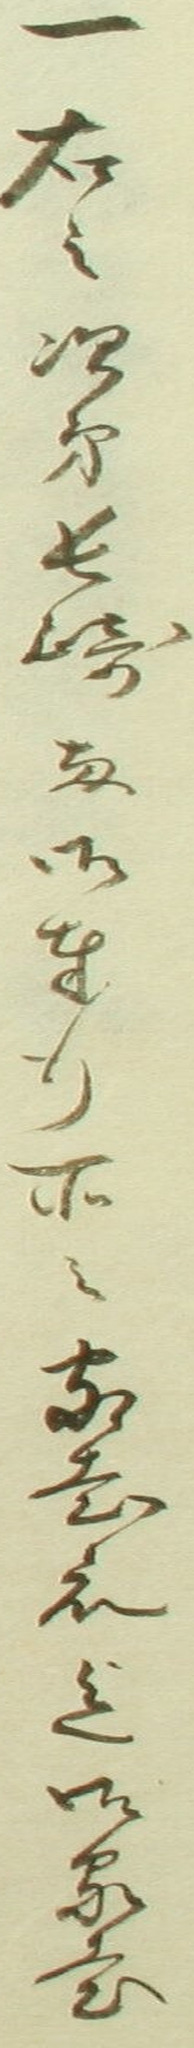一右之次第長崎両御奉行所之家老衆迄御家老
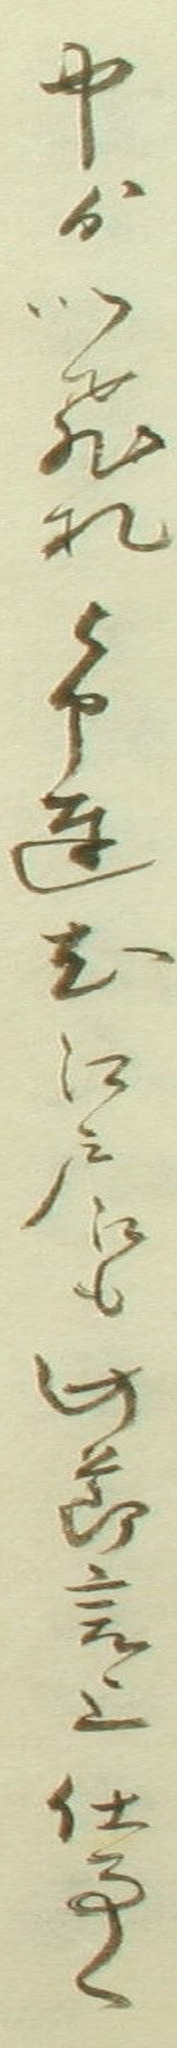中より以飛札被申達尤江戸えも此節言上仕事候
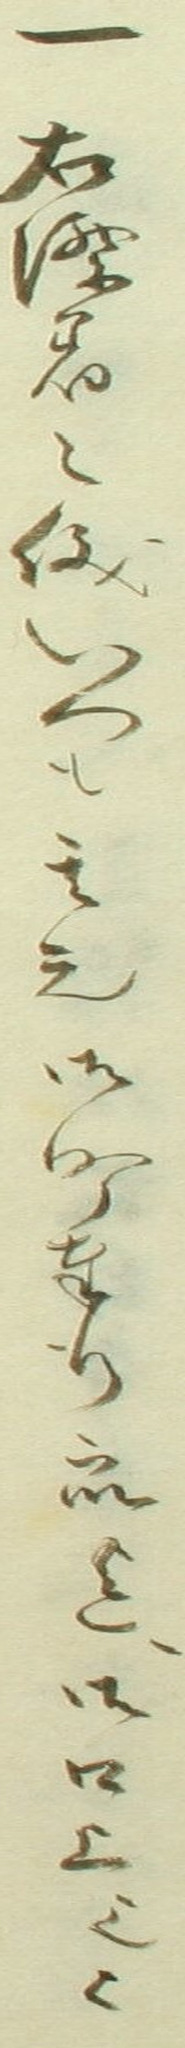一右漂着之儀いつも其元御町奉行衆迄御口上にて被
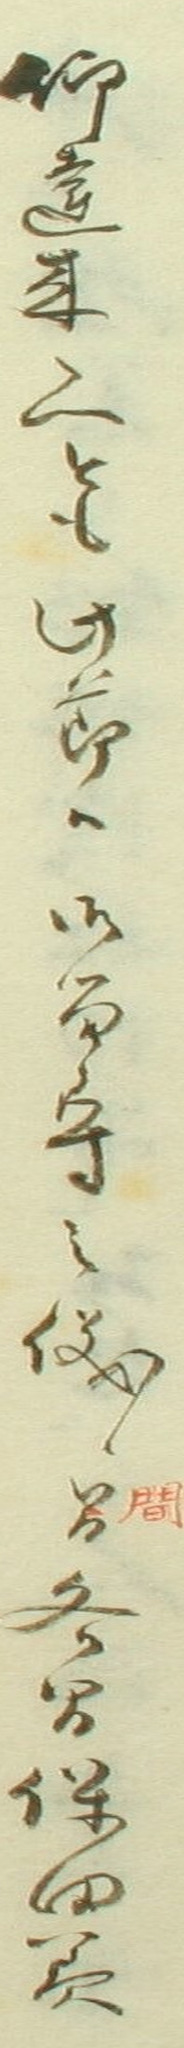仰達来候へとも此節は御留守之儀候間各間保田美
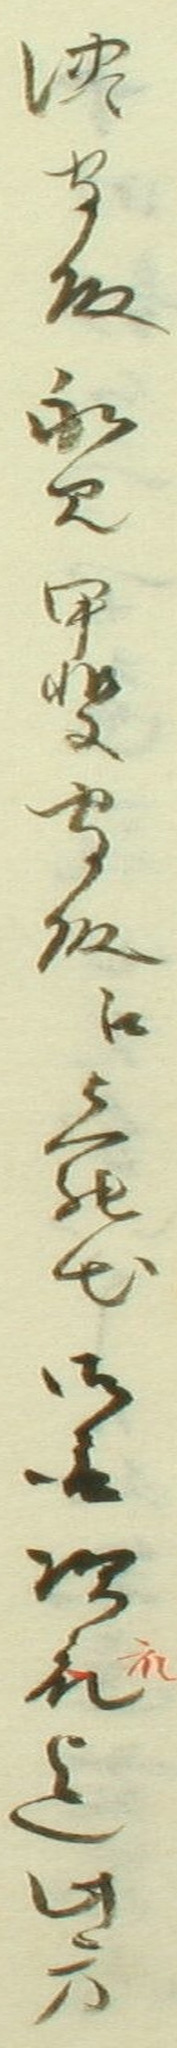濃守殿永見甲斐守殿え被罷出御取次衆迄此方
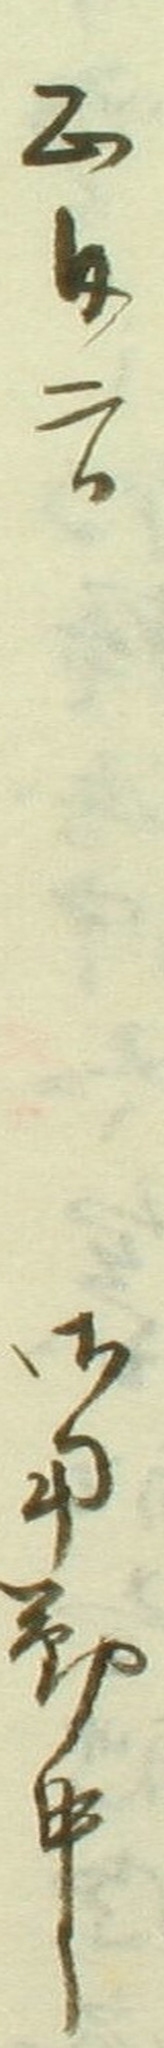正月二日御用勤中
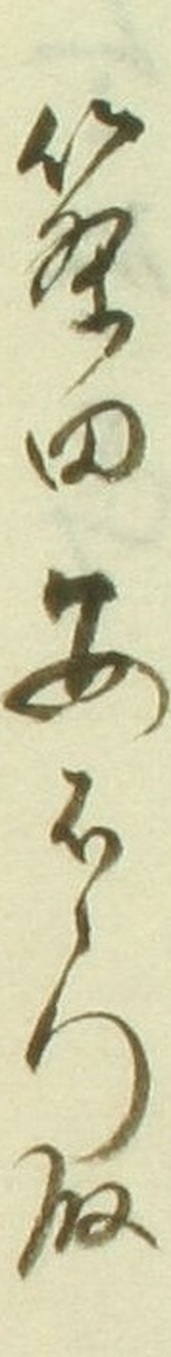篠田安右衛門殿
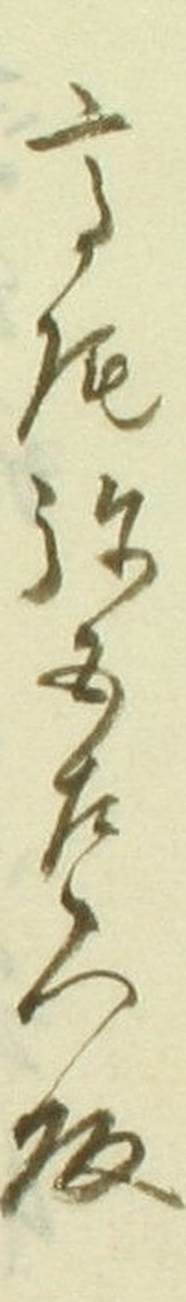高尾弥五左衛門
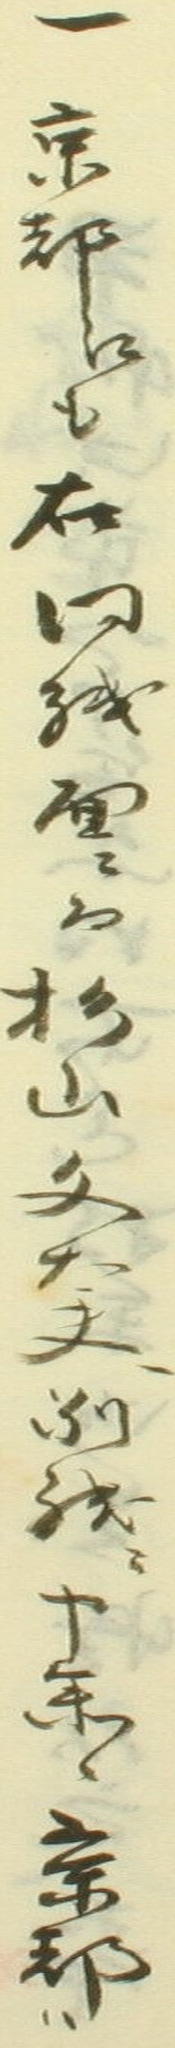一京都えも右同紙面にて杉山文太夫別紙に申来候京都
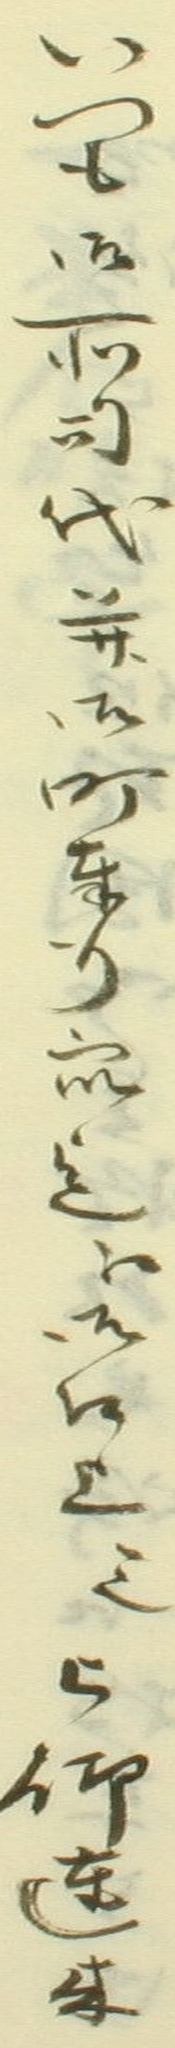いつも所司代并御町奉行衆迄え御口上にて被仰達来
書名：朝鮮船御領内漂流記 坤
